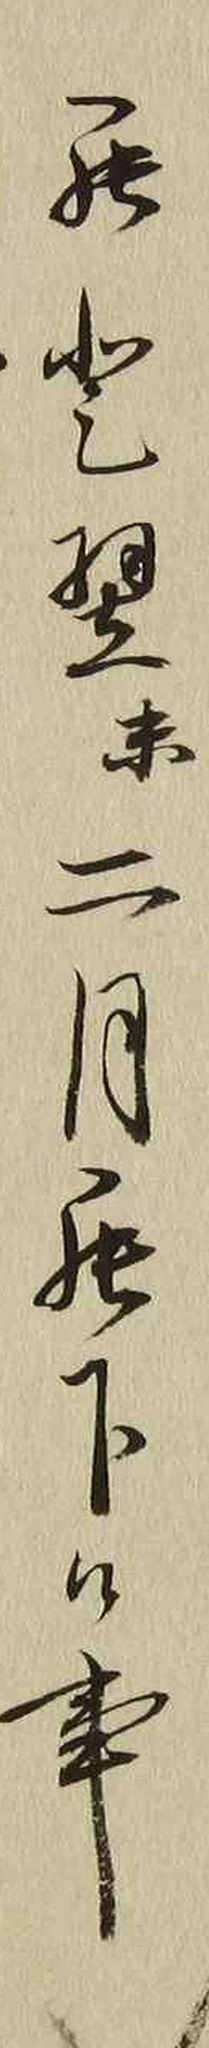罷登翌未二月罷下候事
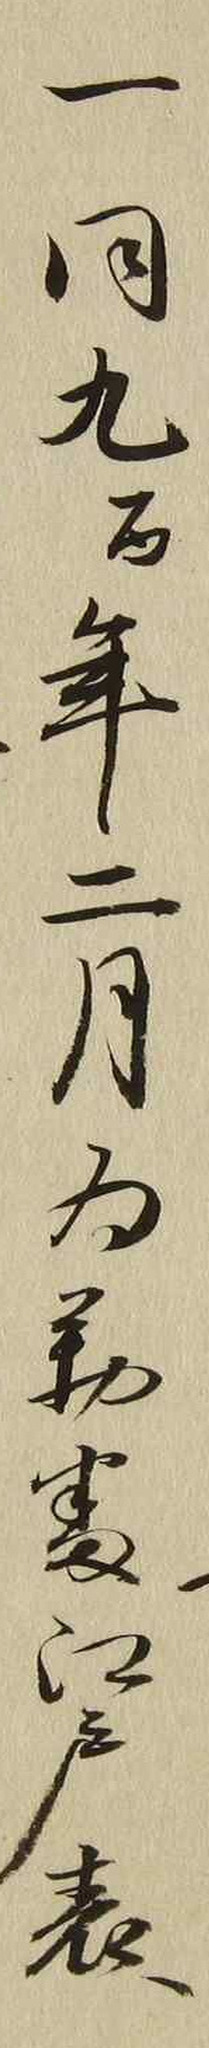一同九酉年二月為勤番江戸表へ
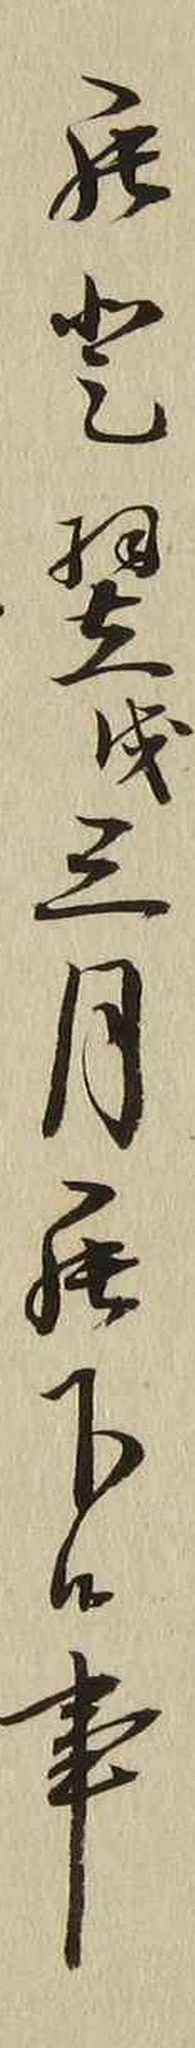罷登翌戌三月罷下候事
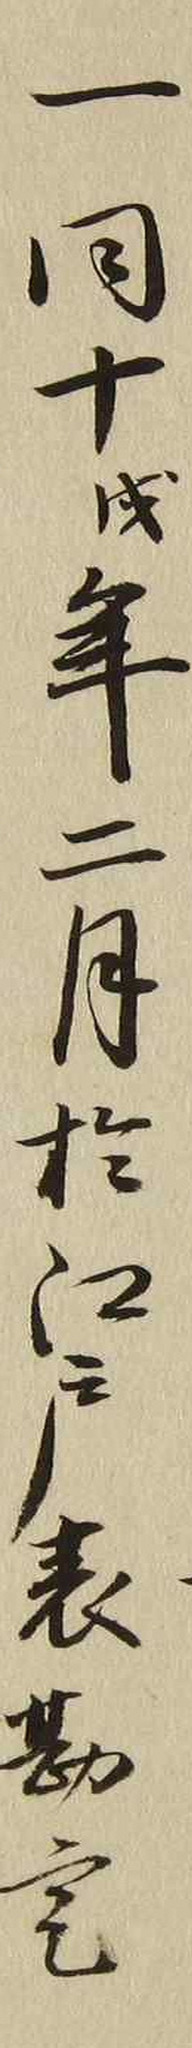一同十戌年二月於江戸表勘定
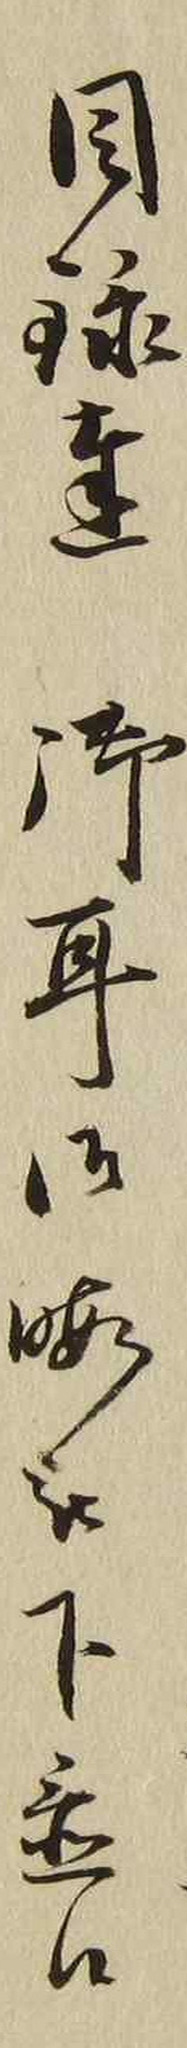目録達御耳御暇被下置候
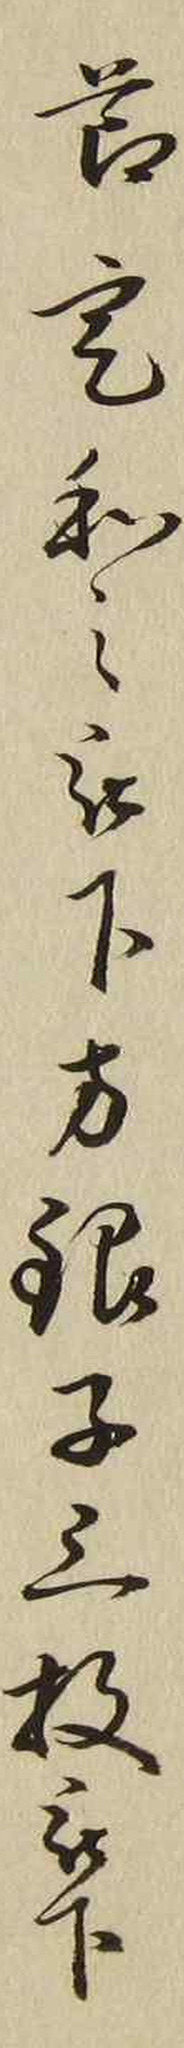節定和之被下方銀子三枚被下
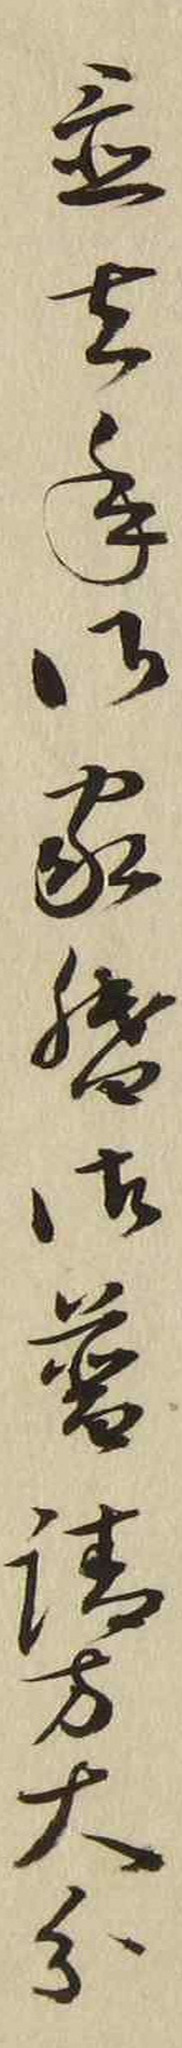置去年家督御普請方大分

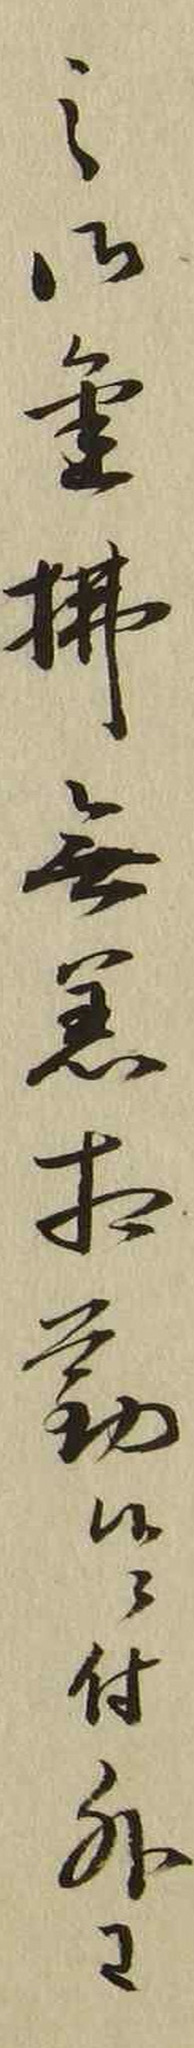之御金払無恙相勤候ニ付外ニ
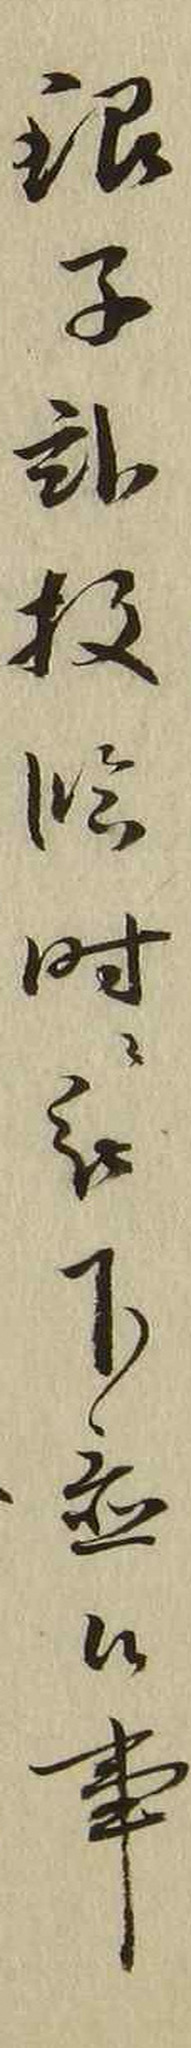銀子弐枚臨時ニ被下置候事
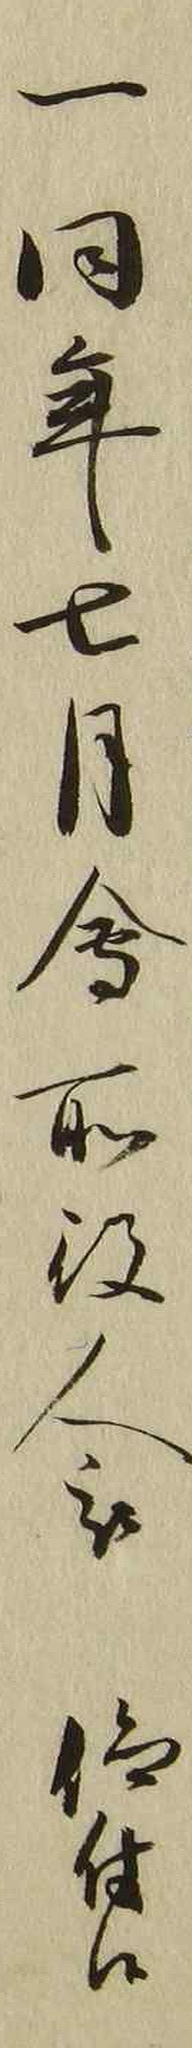一同年七月会所役人被仰付候
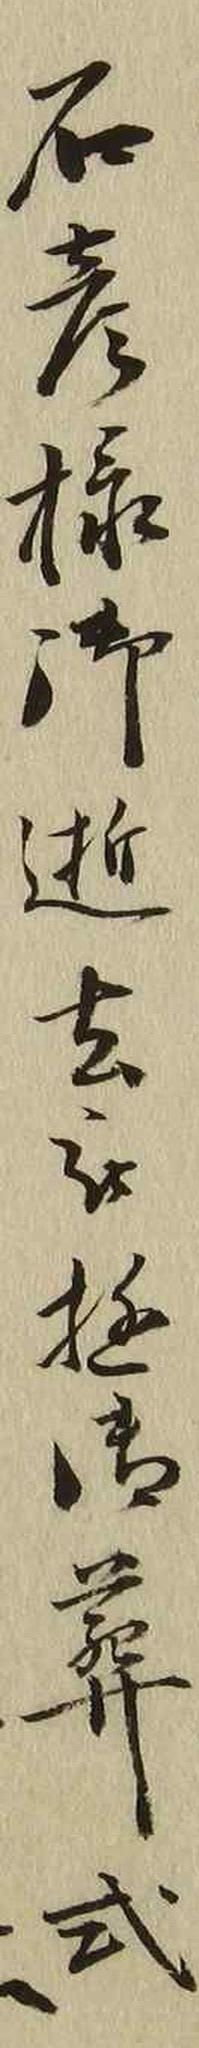石彦様御逝去被遊御葬式
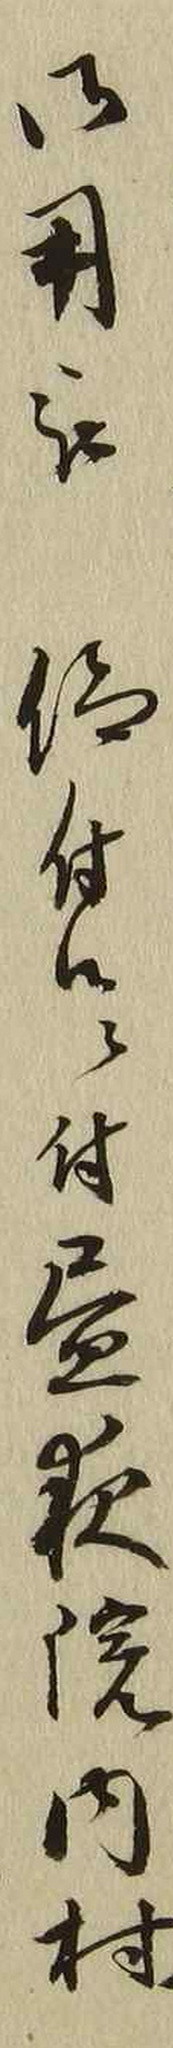御用被仰付候ニ付昼夜院内村
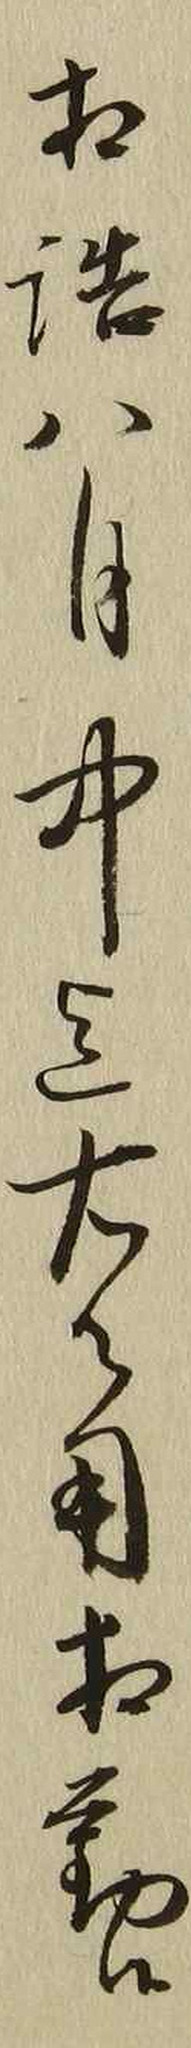相詰八月中迄右之用相勤候
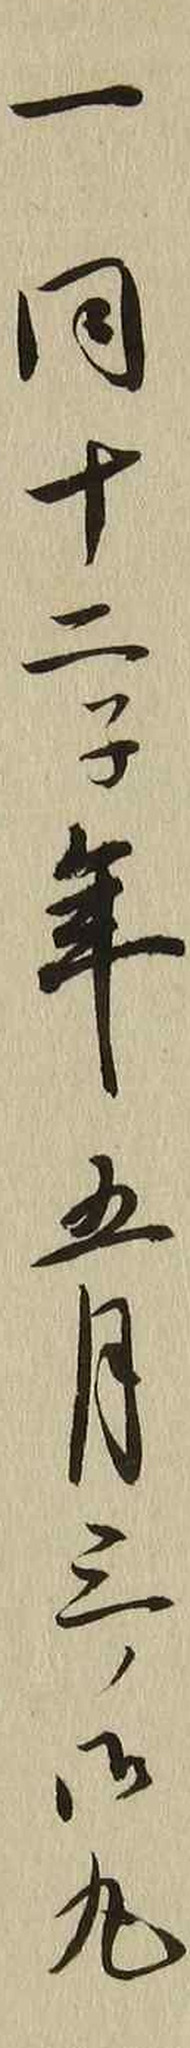一同十二子年五月三ノ丸
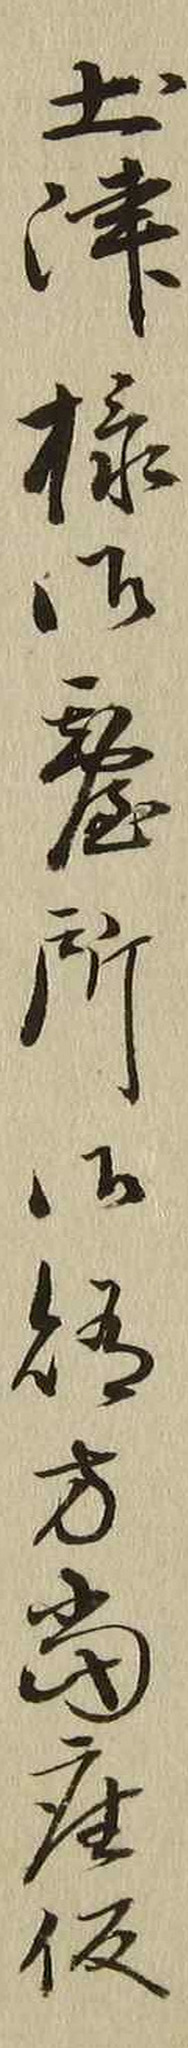土津様御台所御賄方当座仮
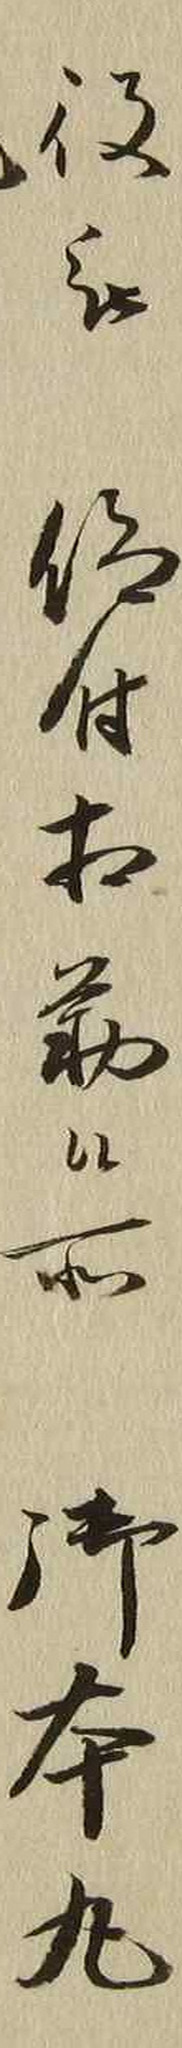役被仰付相勤候所御本丸
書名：諸士系譜　巻之61　と之部4
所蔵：会津若松市立会津図書館
